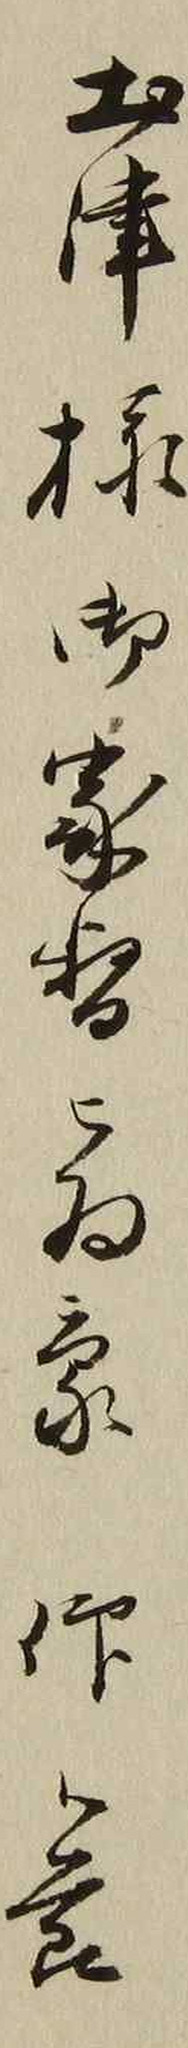土津様御家督被為蒙仰候節
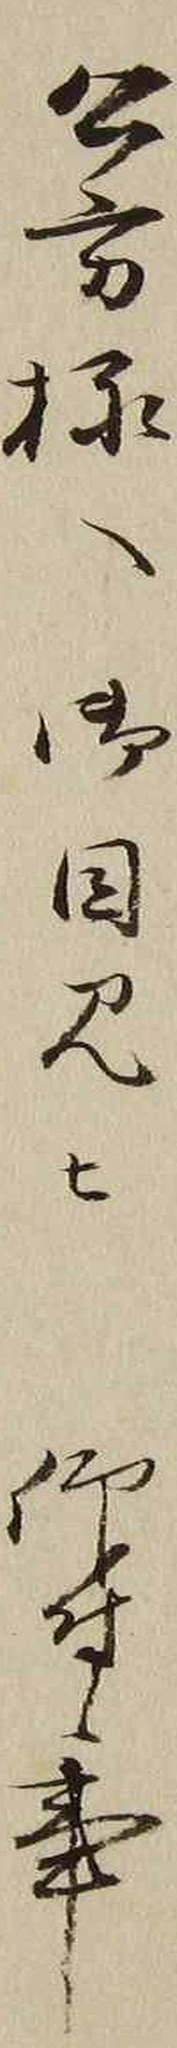公方様へ御目見被仰付候事
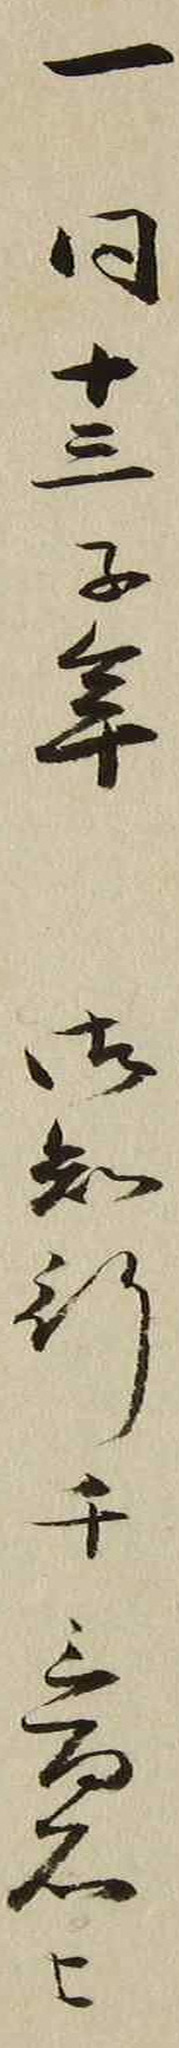一同十三子年御知行千三百石被
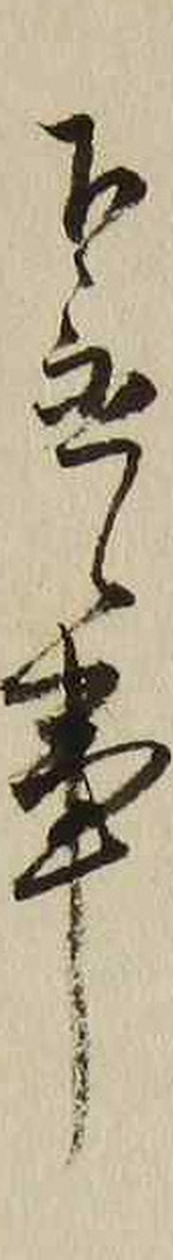下置候事
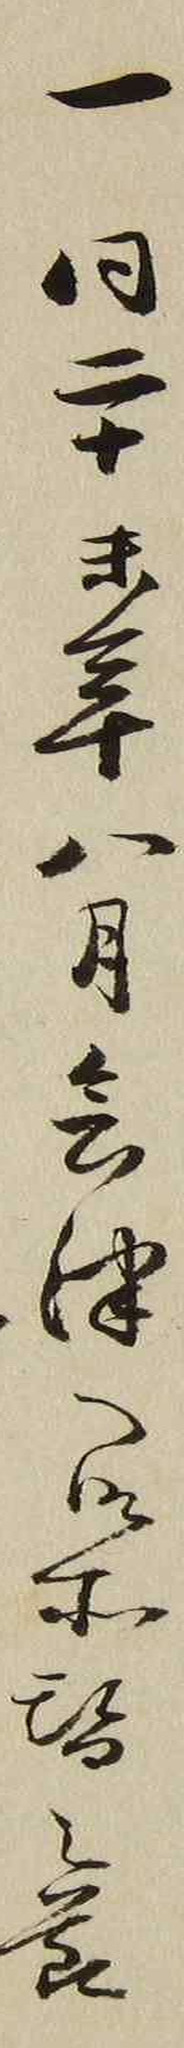一同二十未年八月会津へ御所替之節
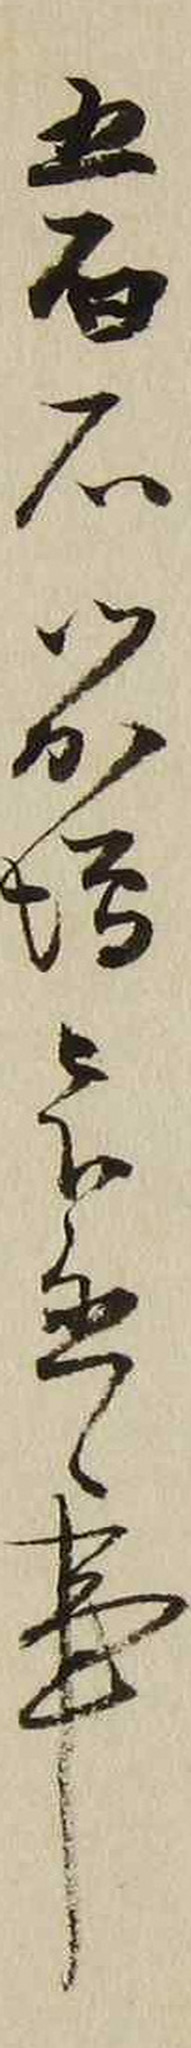五百石御加増被下置候事
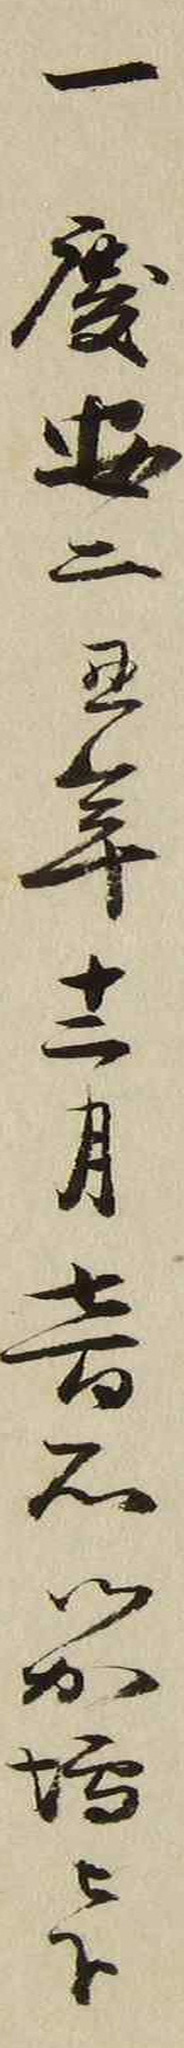一慶安二丑年十二月七百石御加増被下
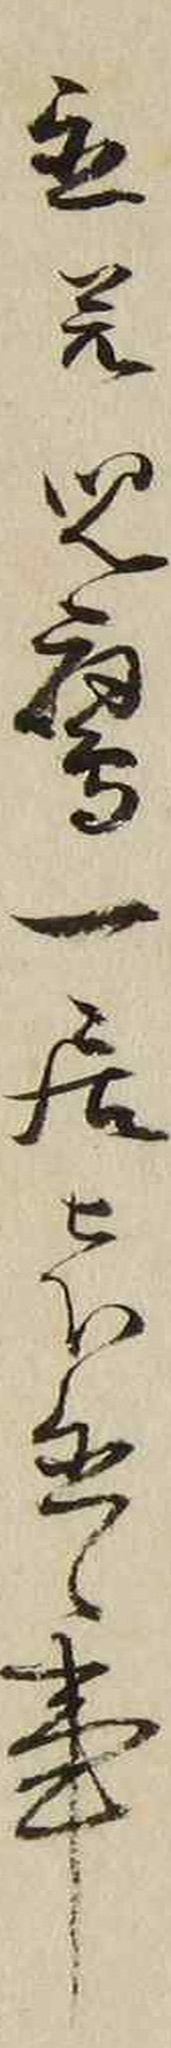置并児鷹一居被下置候事
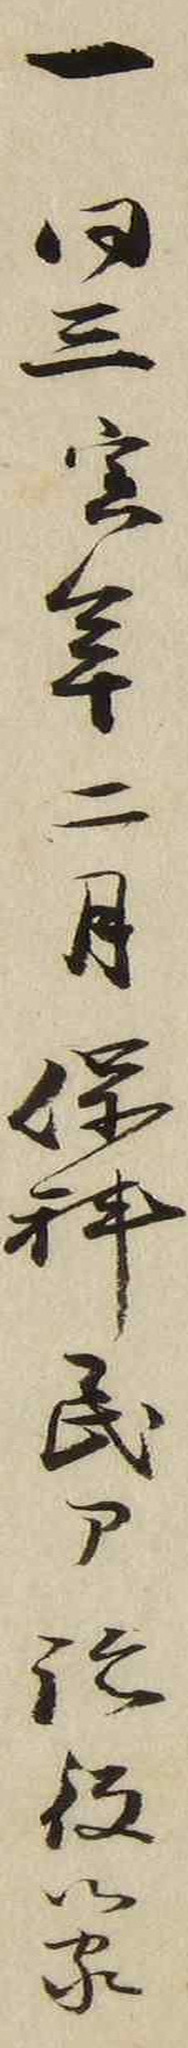一同三寅年二月保科民部跡役御家

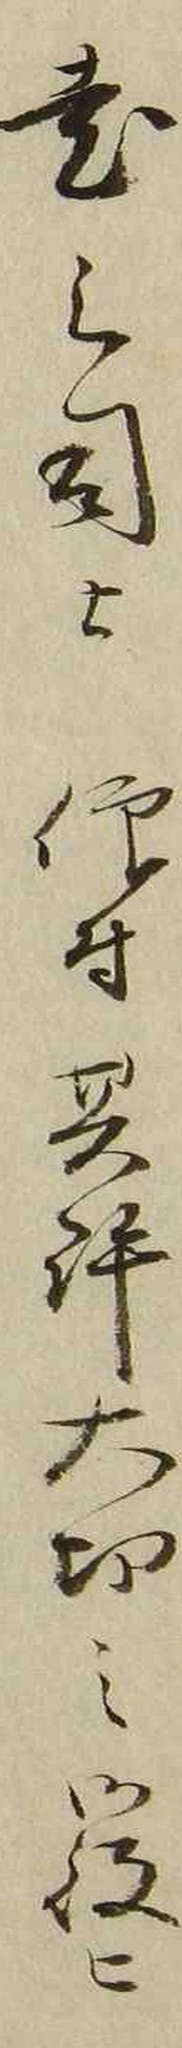老之司被仰付其許大切之御役被
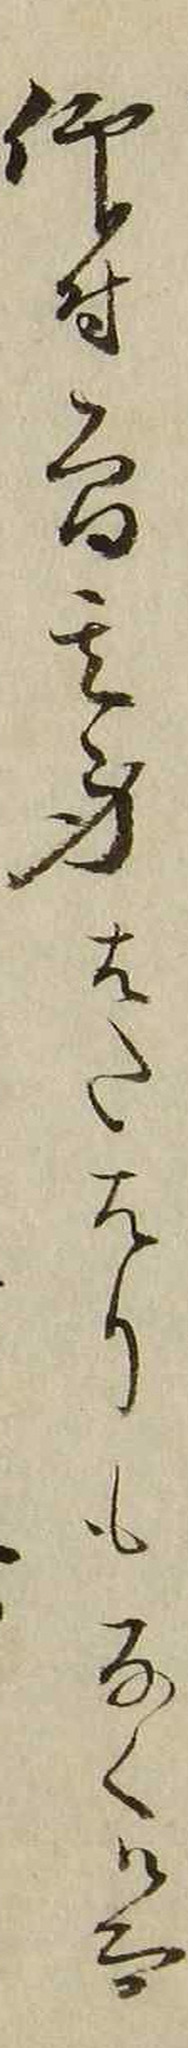仰付候間其身はたはりもなく候而
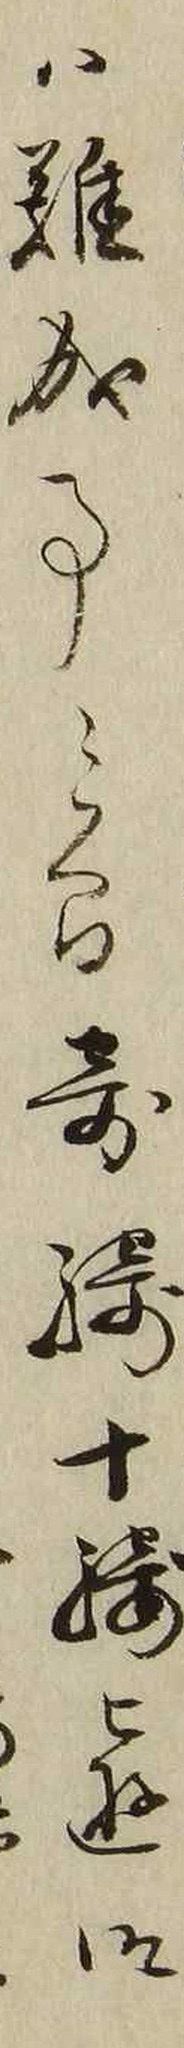は難成事に候間寄騎十騎被遊御
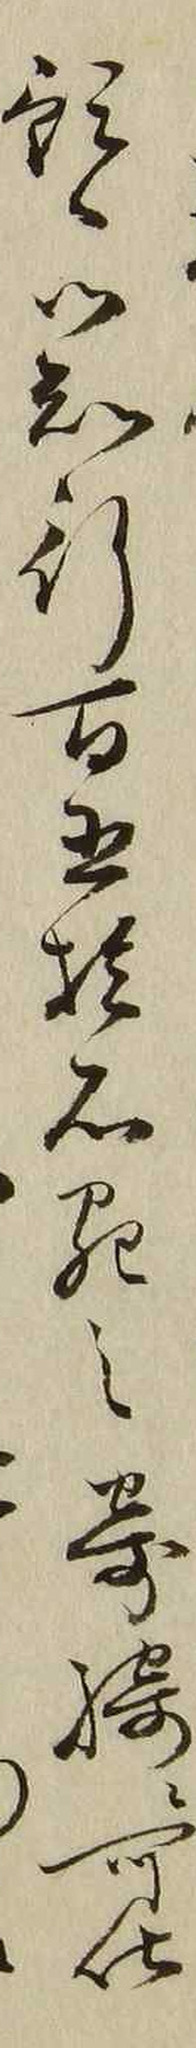預候御知行百五拾石宛之寄騎に可仕
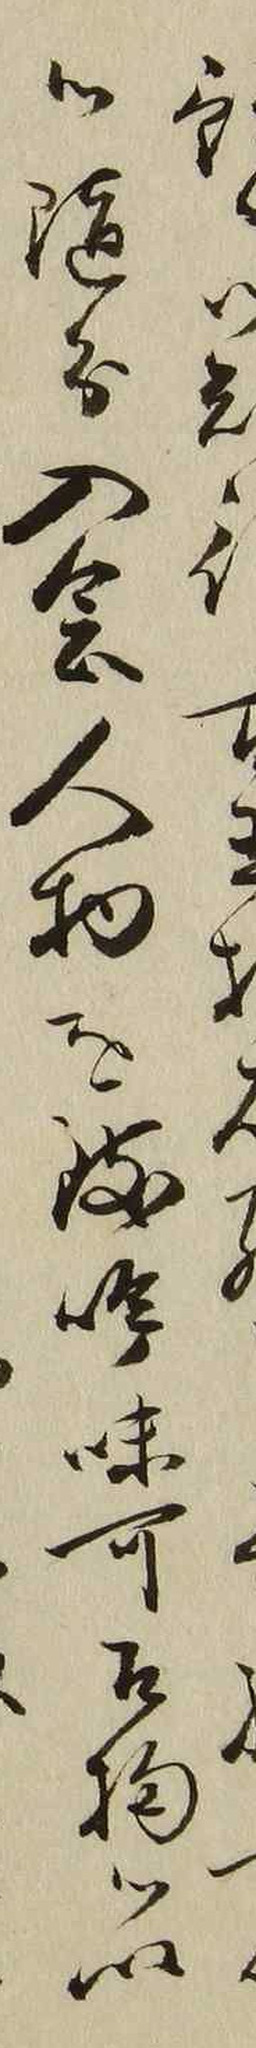候随分入念人物を致吟味可召抱候以
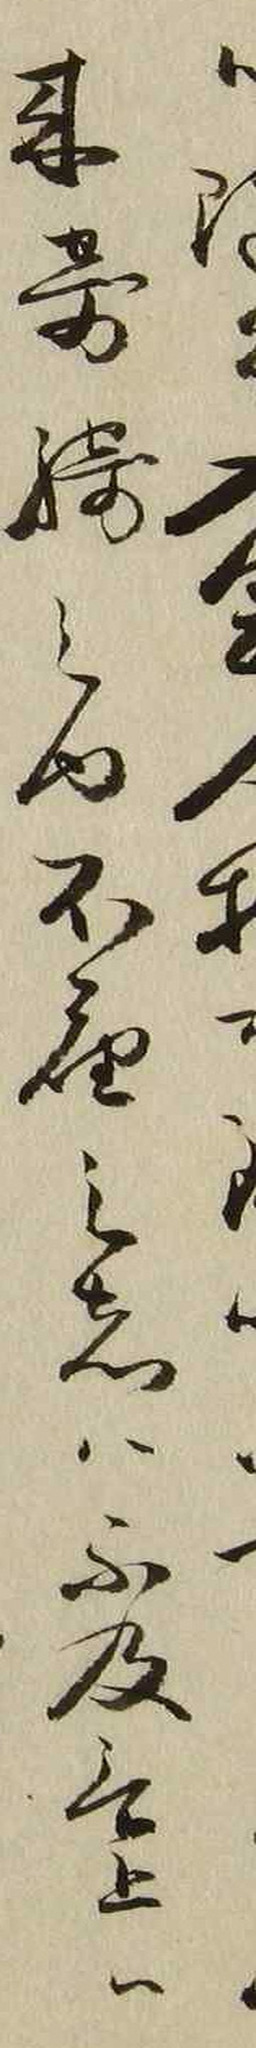来寄騎之内不届之者は不及言上候
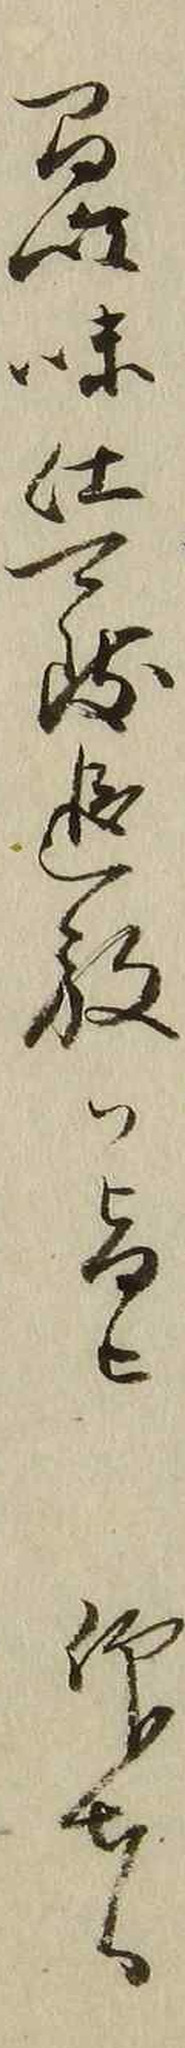間吟味仕可致追放候旨被仰出候
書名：諸士系譜　巻之292　き之部1
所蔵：会津若松市立会津図書館
